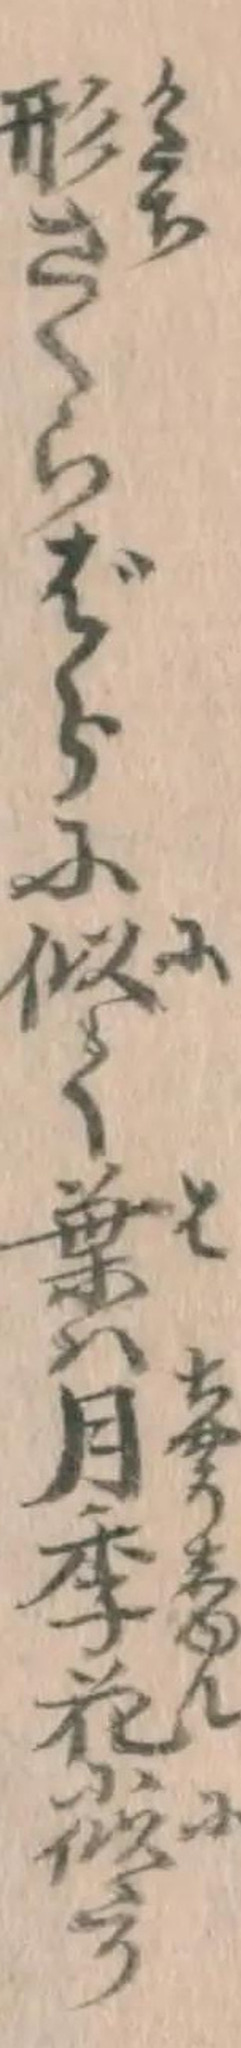形さくらばらに似て葉は月季花に似たり
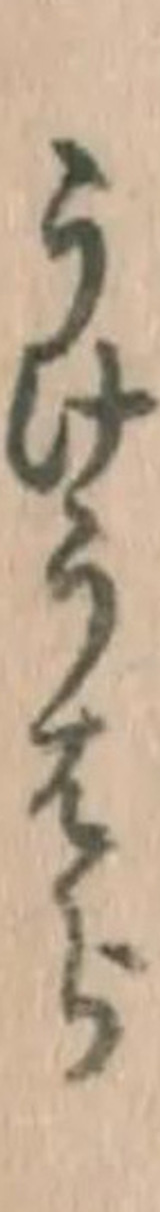うけうはら

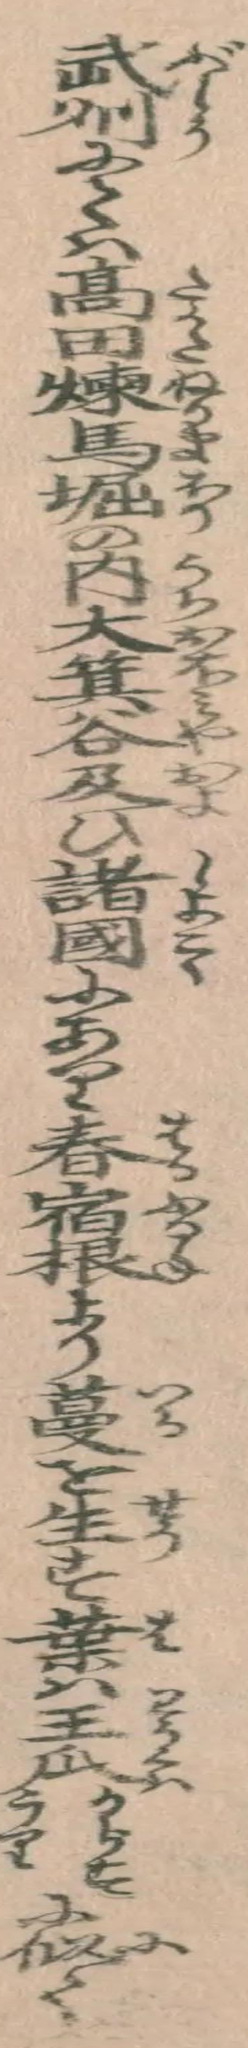武州にては高田煉馬堀の内大箕谷及ひ諸国にあり春宿根より蔓を生す葉は王瓜からすうりに似て
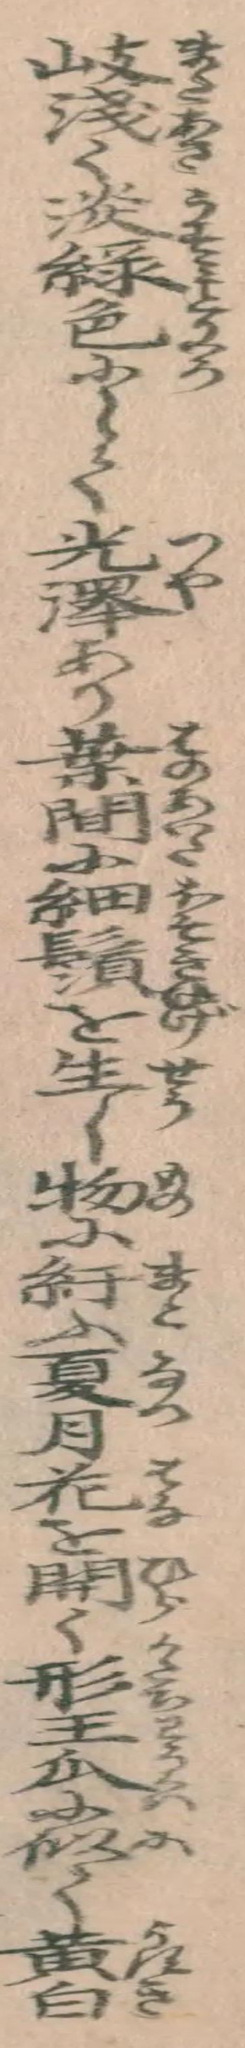岐浅く淡緑色にして光沢あり葉間に細鬚を生し物に紆ふ夏月花を開く形王瓜に似て黄白
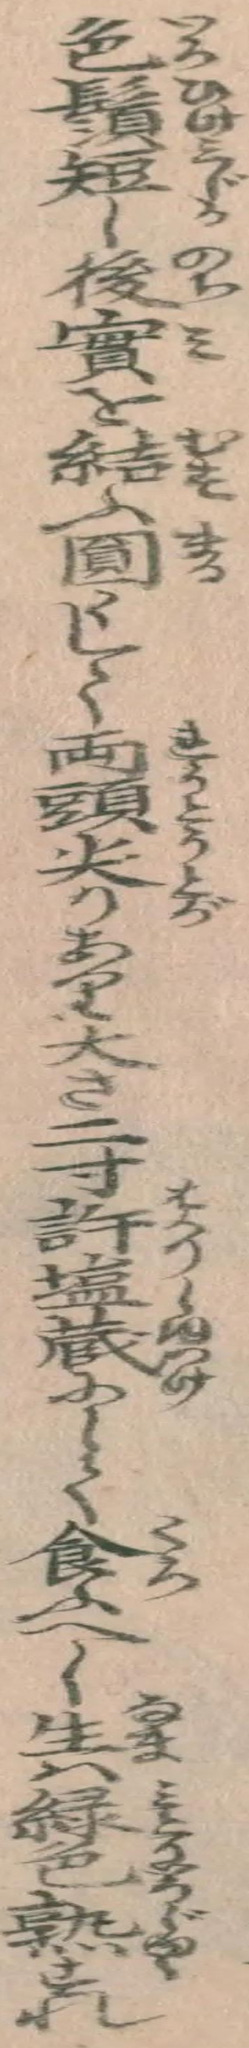色鬚短し後実を結ふ円くして両頭尖りあり大さ二寸許塩蔵にして食ふへし生は緑色熟すれ
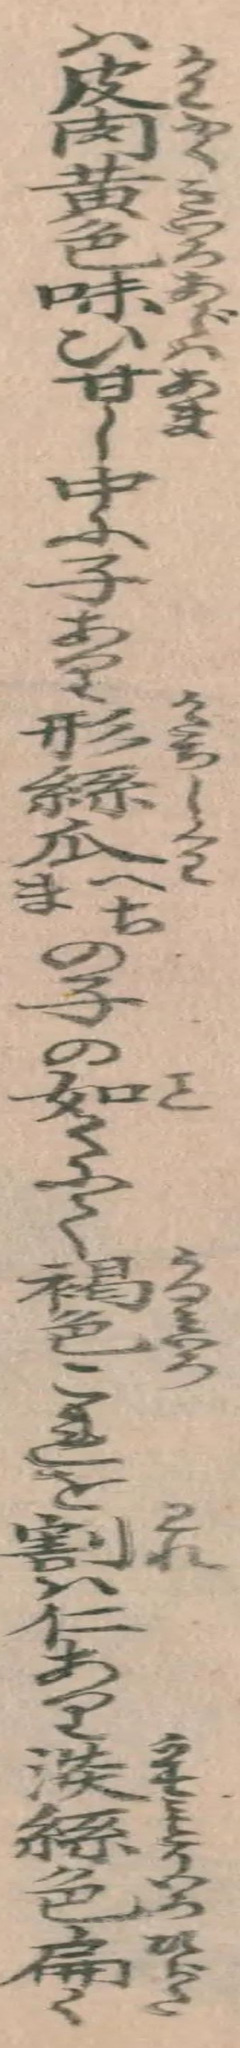は皮肉黄色味ひ甘し中に子あり形糸瓜へちまの子の如くにて褐色これを割は仁あり淡糸色扁く
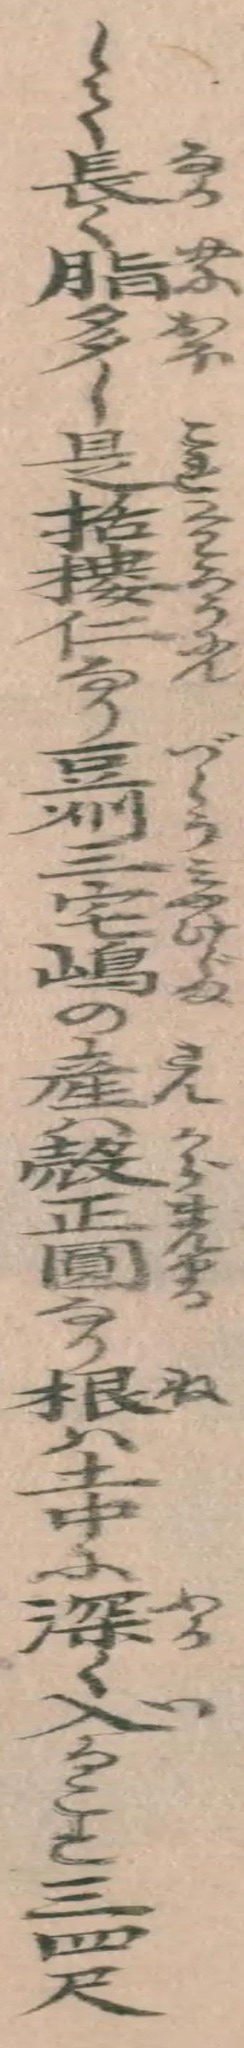して長く脂多し是括楼仁なり豆州三宅嶋の産は殻正円なり根は土中に深く入ること三四尺
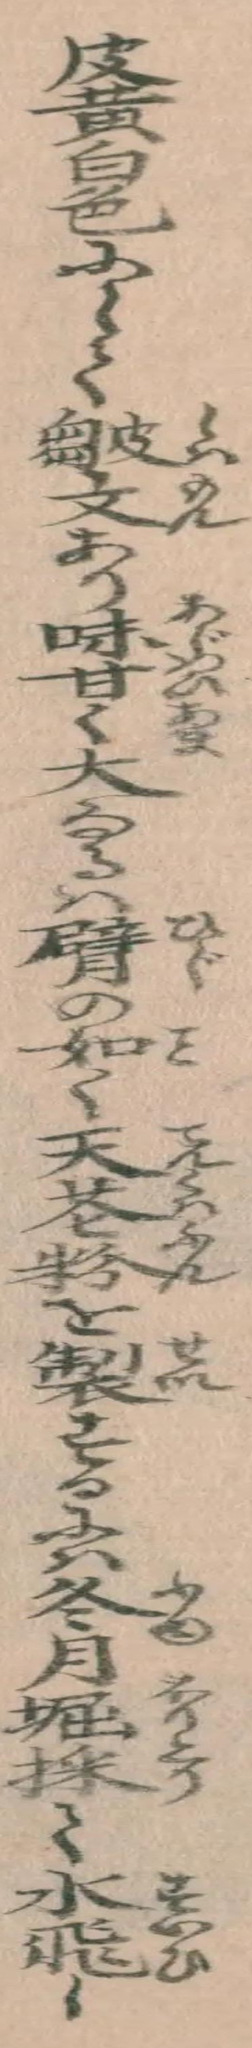皮黄白色にして皺文あり味甘く大なるは臂の如く天花粉を製するには冬月堀採て水飛し
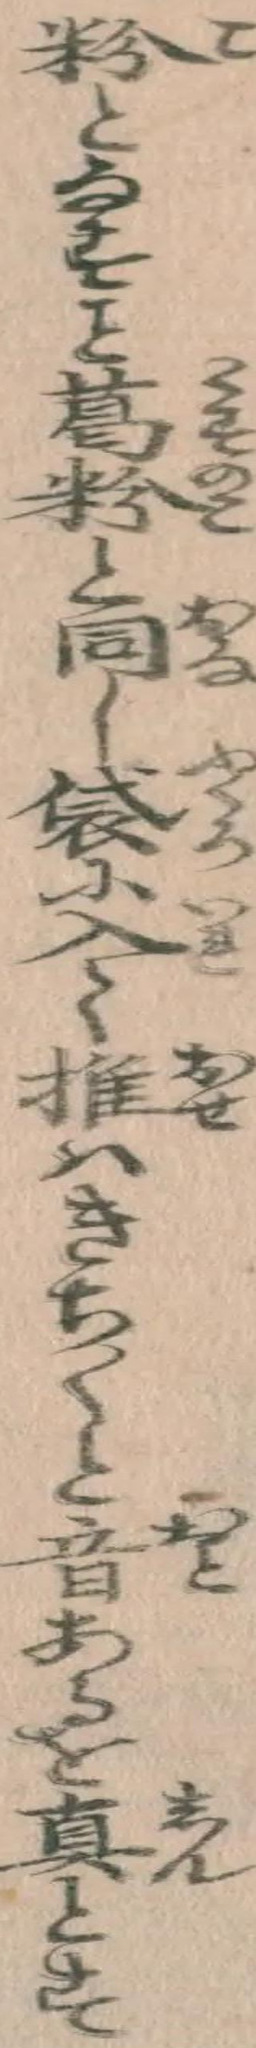粉となすこと葛粉と同し袋に入て推はきち〱と音あるを真とす
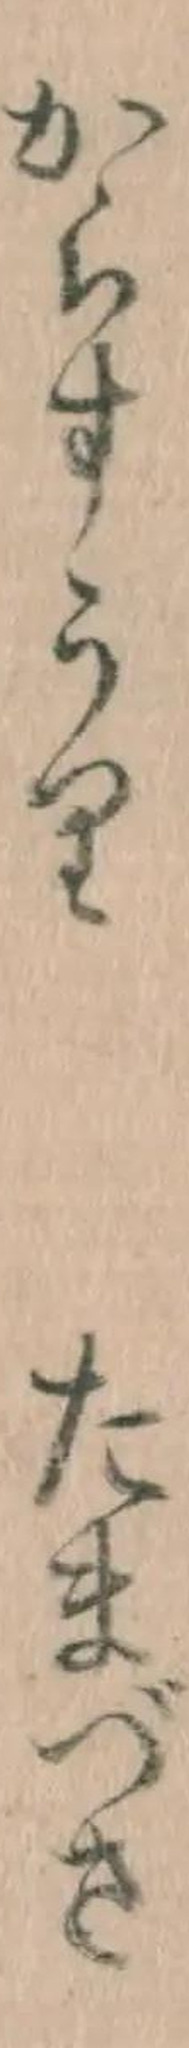からすうりたまづさ
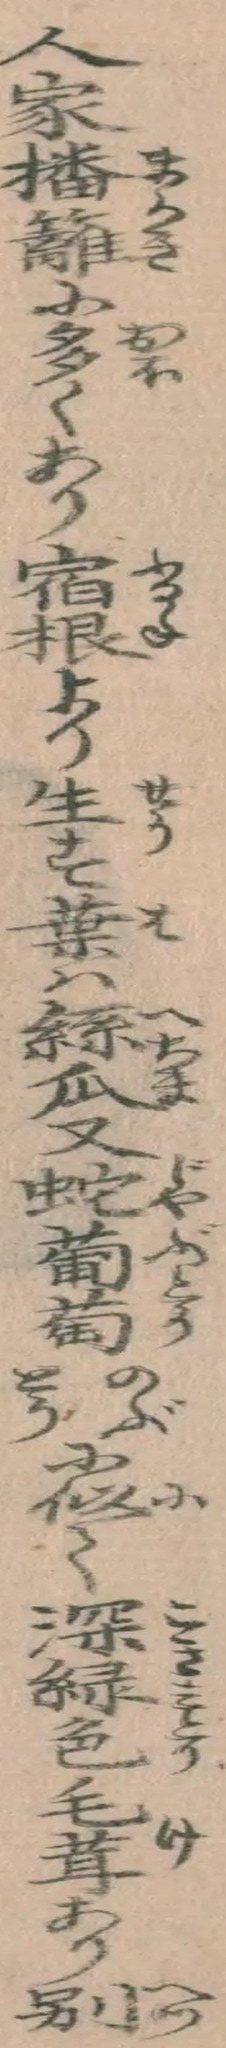人家播籬に多くあり宿根より生す葉は糸瓜又蛇葡萄のぶとうに似て深緑色毛茸あり別
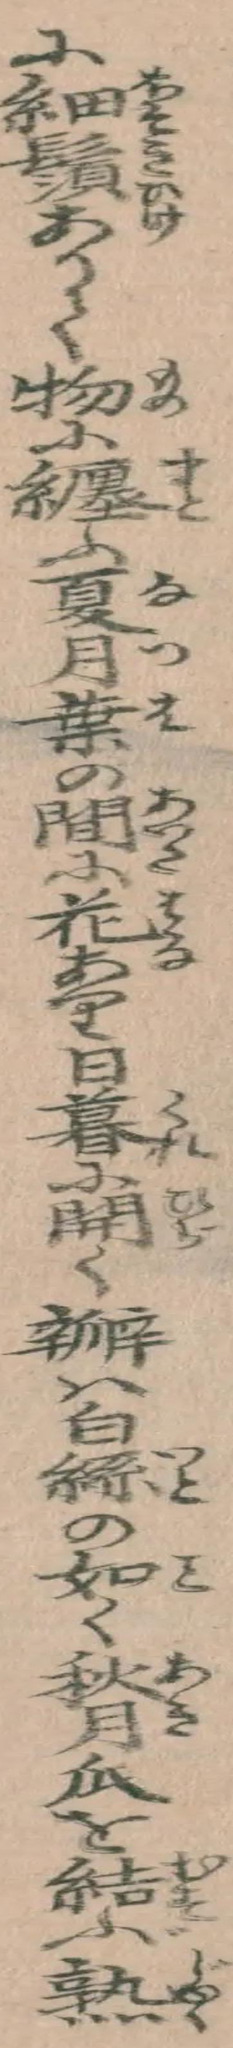に細鬚ありて物に纏ふ夏月葉の間に花あり日暮に開く弁は白糸の如く秋月瓜を結ぶ熟
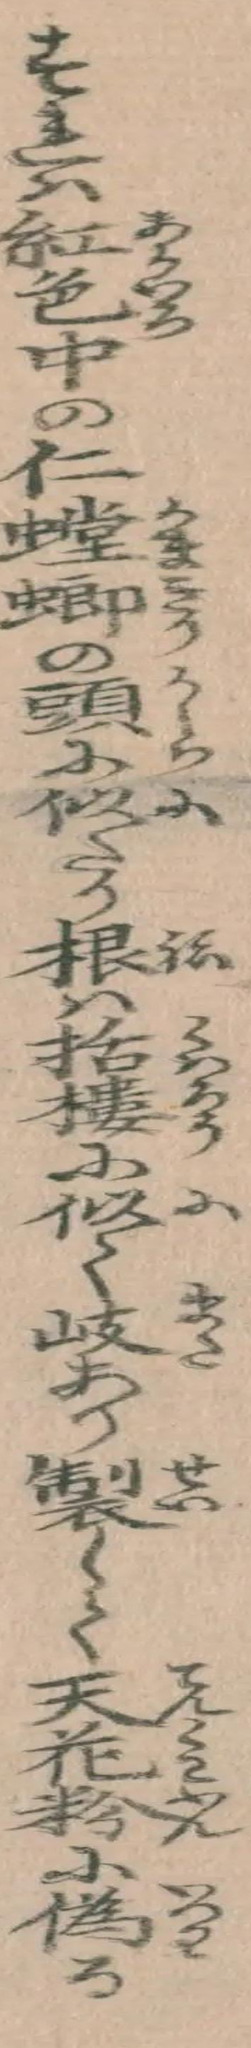すれは紅色中の仁螳螂の頭に似たり根は括楼に似て岐あり製して天花粉に偽る

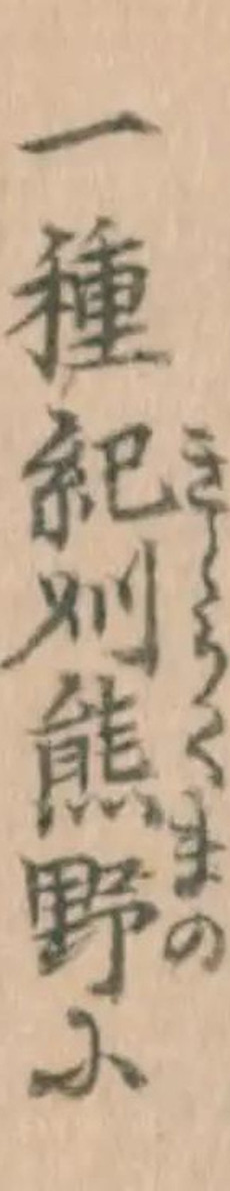一種紀州熊野に
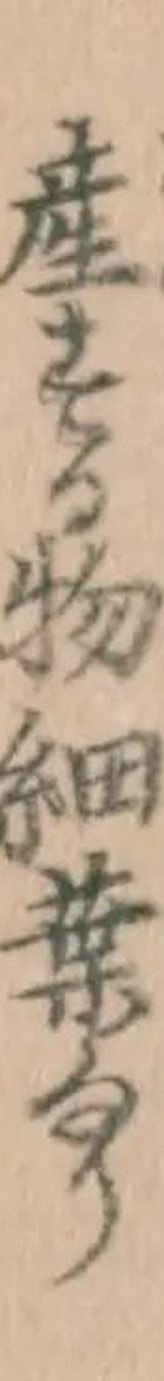産する物細葉なり

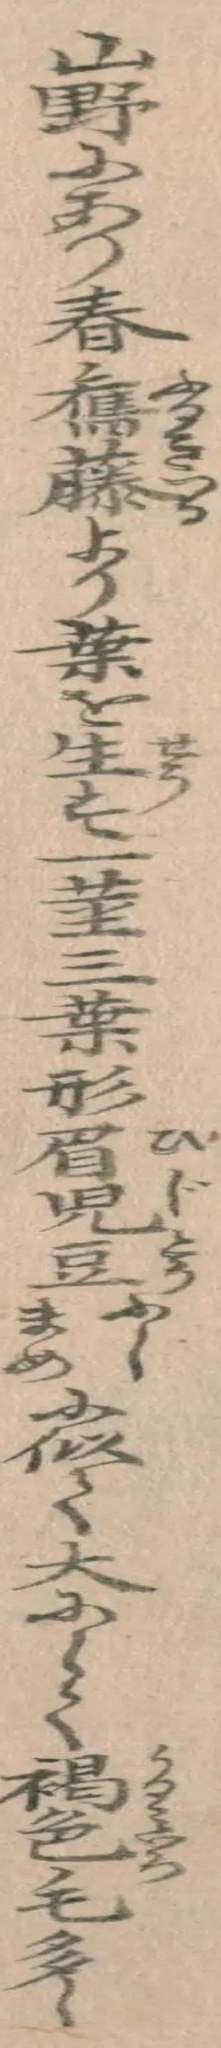山野にあり春旧藤より葉を生す一茎三葉形眉児豆ふしまめに似て大にして褐色毛多し
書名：本草図譜. 巻25-27
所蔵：国立国会図書館 National Diet Library, JAPAN
